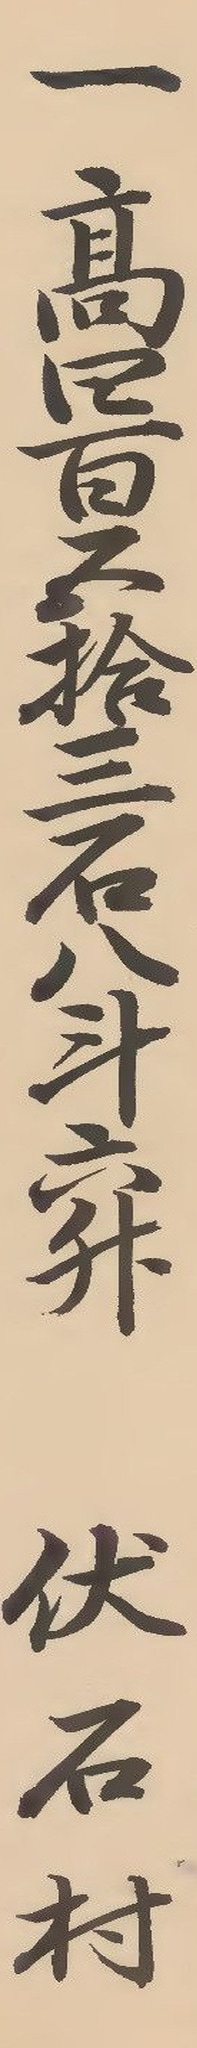一高四百五拾三石八斗六升伏石村
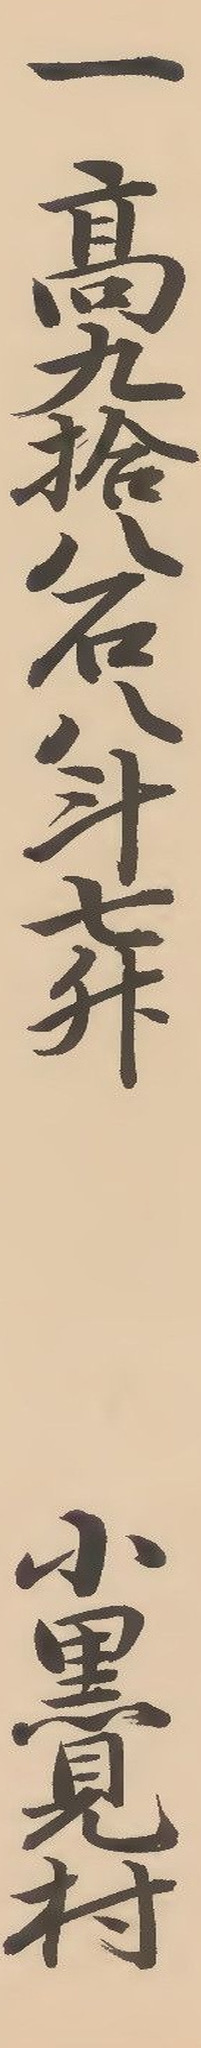一高九拾八石八斗七升小黒見村
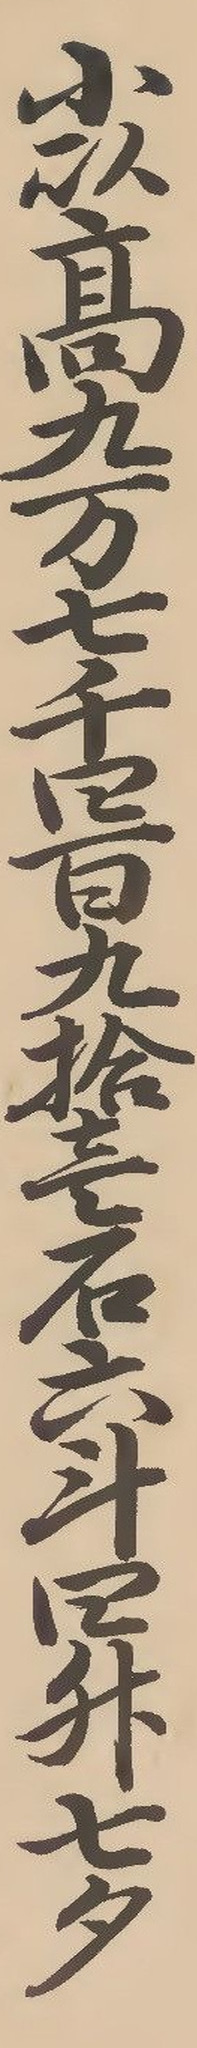小以高九万七千四百九拾壱石六斗四升七勺

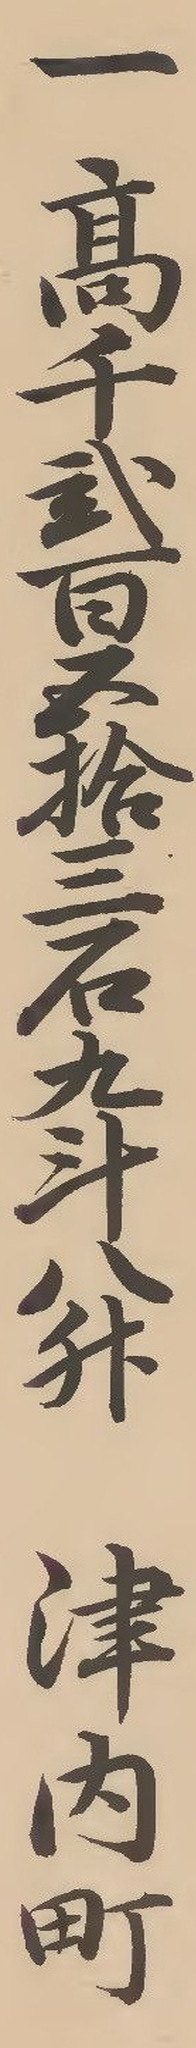一高千弐百五拾三石九斗八升津内町
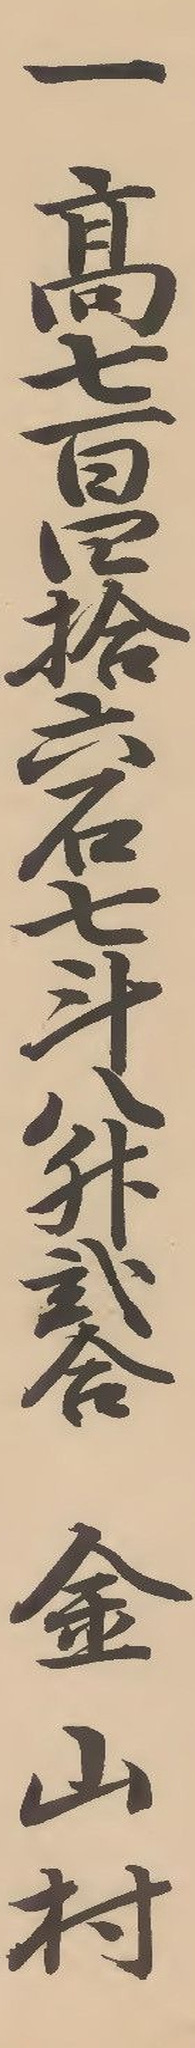一高七百四拾六石七斗八升弐合金山村
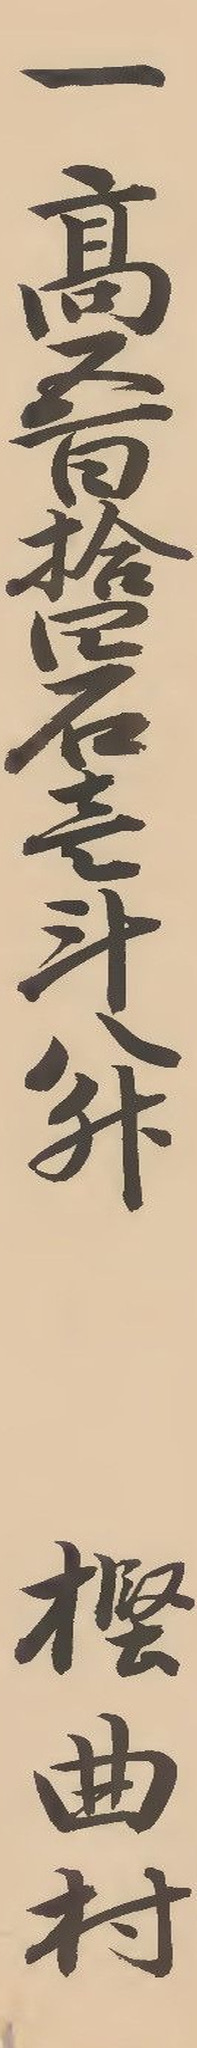一高五百拾四石壱斗八升樫曲村
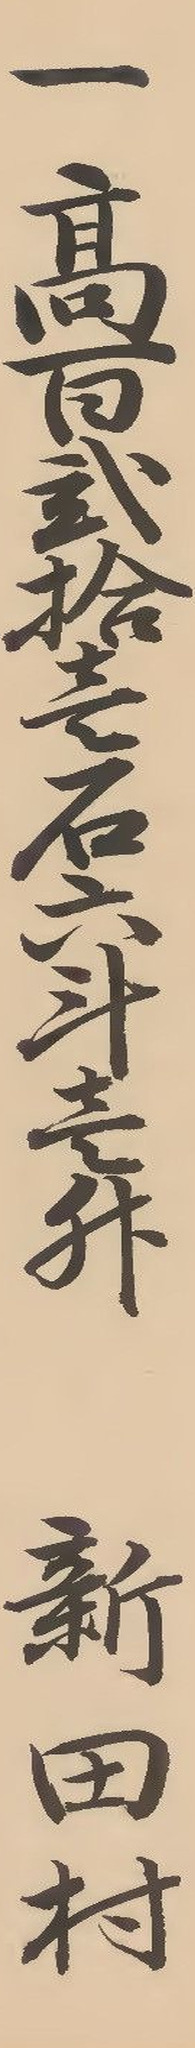一高百弐拾壱石六斗壱升新田村
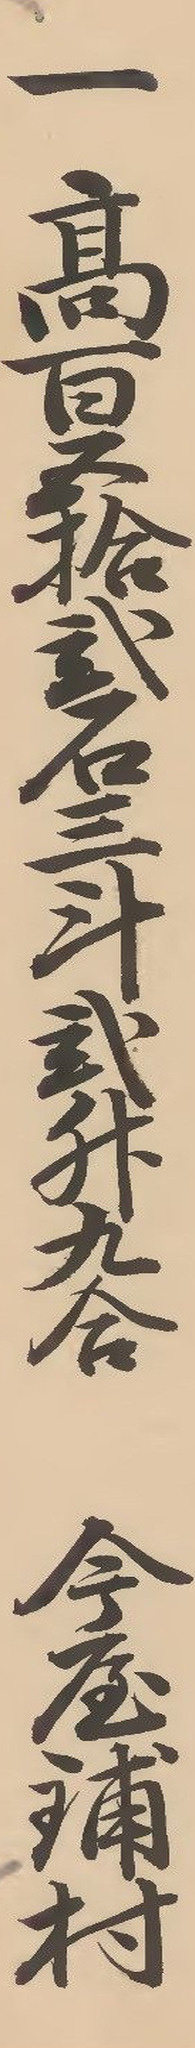一高百五拾弐石三斗弐升九合今屋鋪村

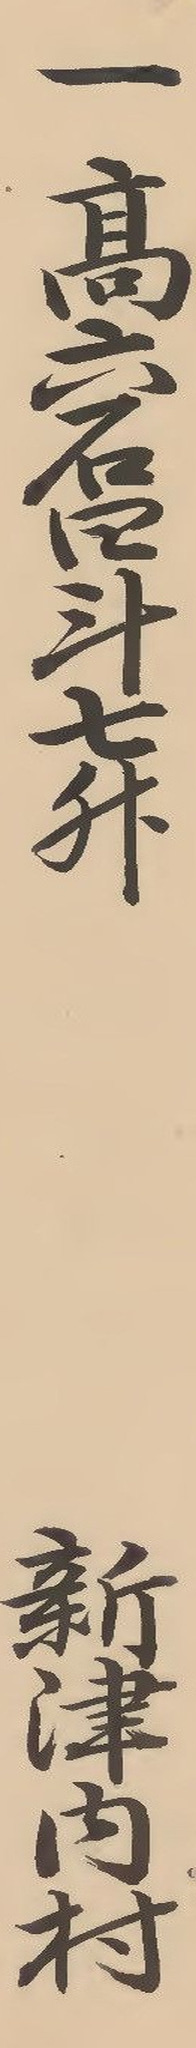一高六石四斗七升新津内村
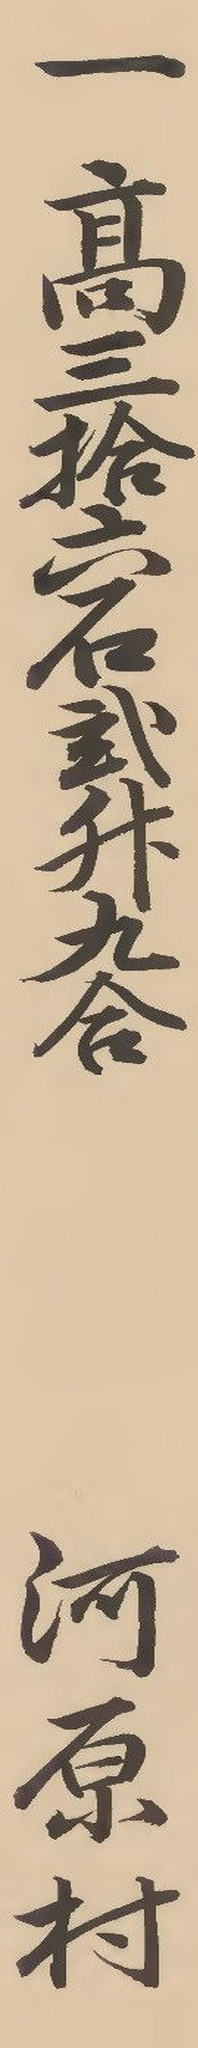一高三拾六石弐升九合河原村
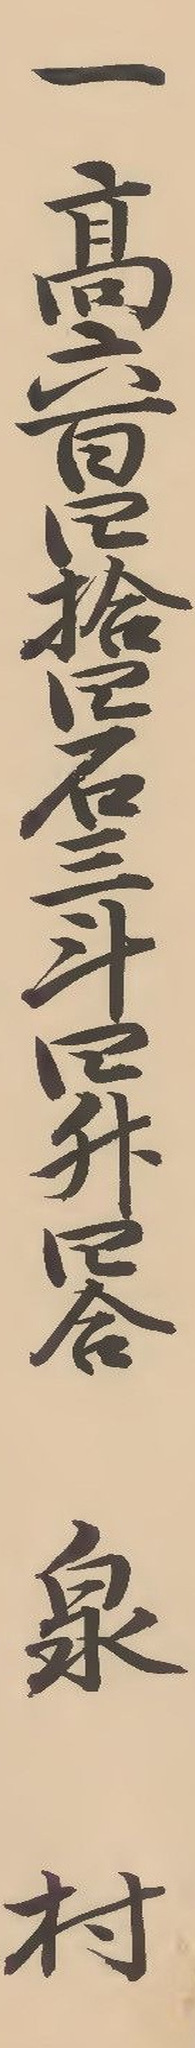一高六百四拾四石三斗四升四合泉村
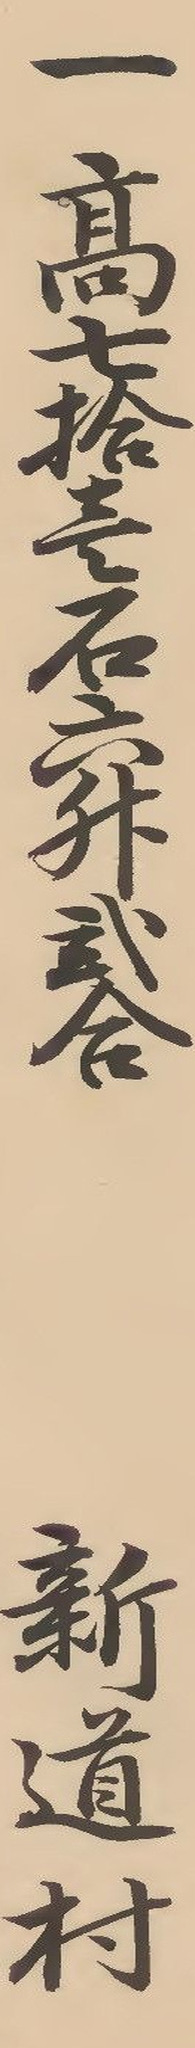一高七拾壱石六升弐合新道村
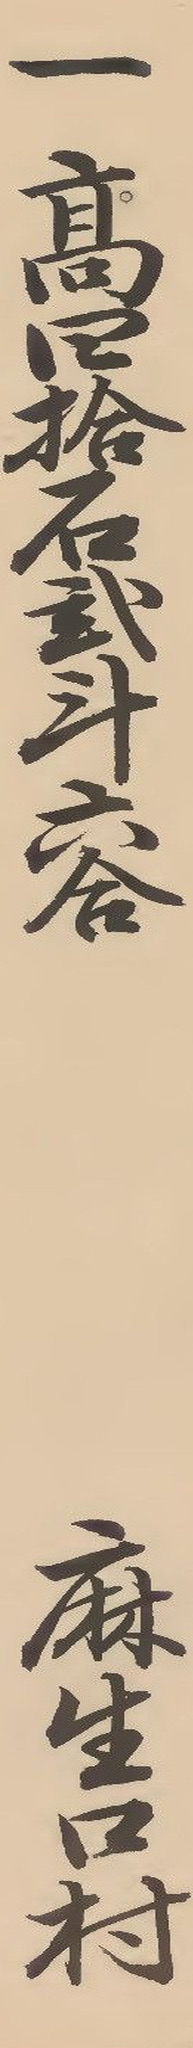一高四拾石弐斗六合麻生口村
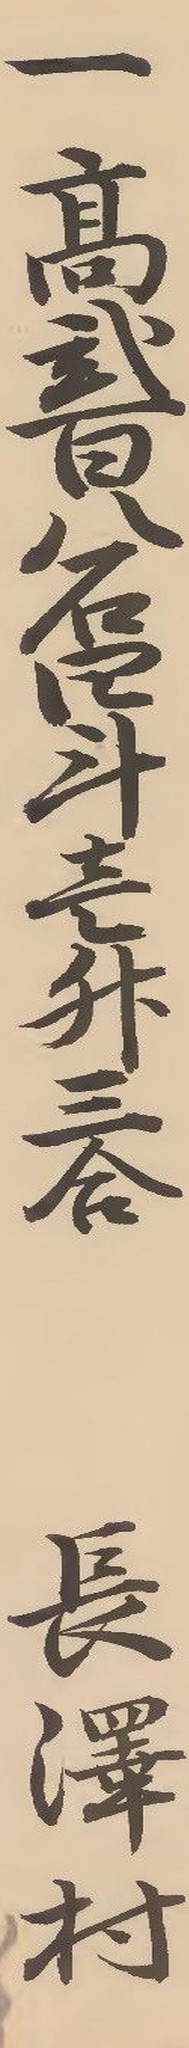一高弐百八石四斗壱升三合長沢村
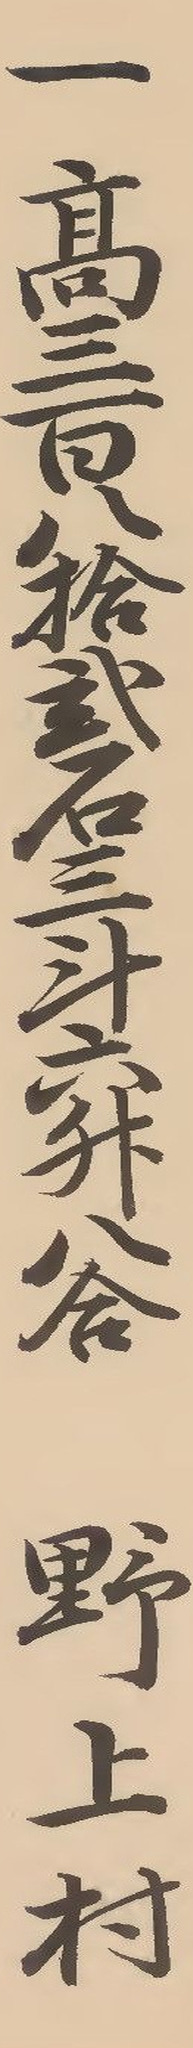一高三百八拾弐石三斗六升八合野上村
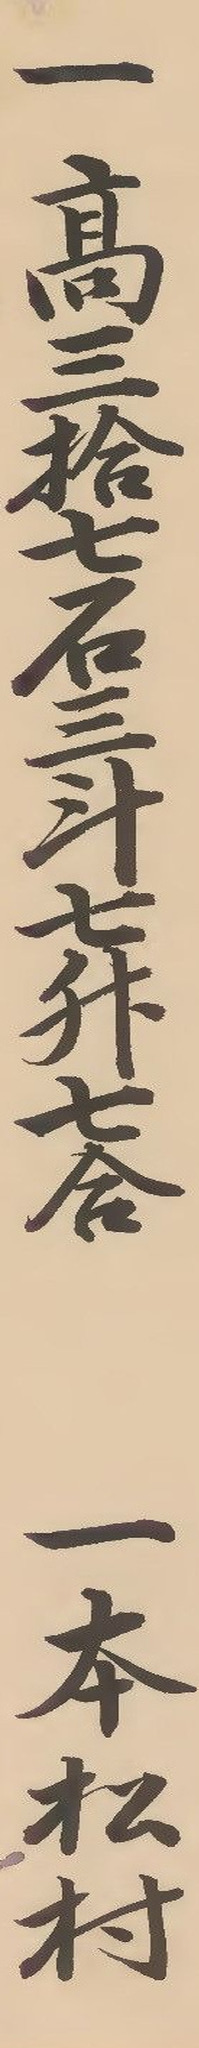一高三拾七石三斗七升七合一本松村
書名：越前国郷帳
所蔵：国立公文書館 National Archives of Japan
